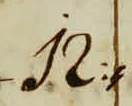12:
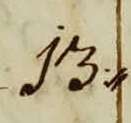13
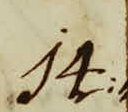14
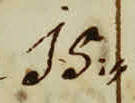15:
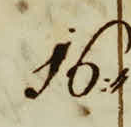16
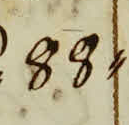88
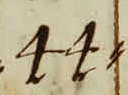44
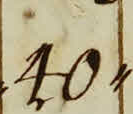40
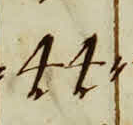44
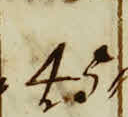45
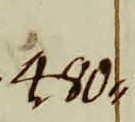480
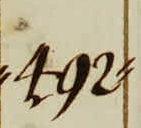492
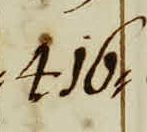416
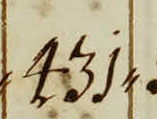431
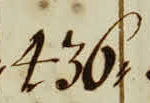436
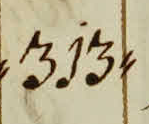313
